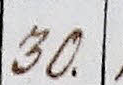30.
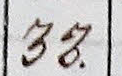33.
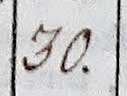30.
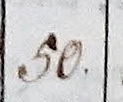50.
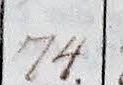74.
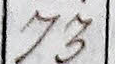73
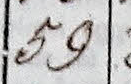59
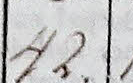42.
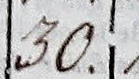30.
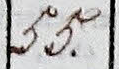55.
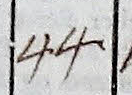44
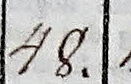48.
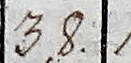38.
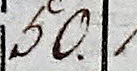50.
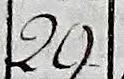29
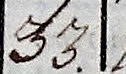33.
